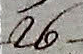26
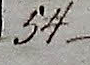54
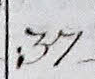37
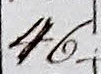46
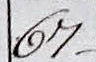67
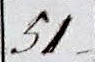51
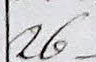26
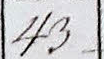43
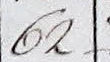62
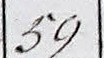59
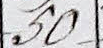50
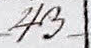43
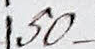50
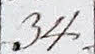34
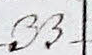33
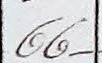66
